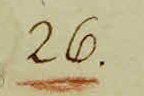26.
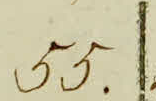55.
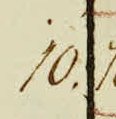10.
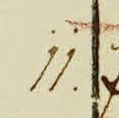11.
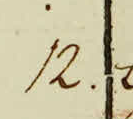12.
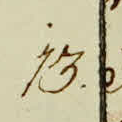13.
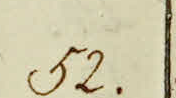52.
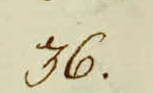36.
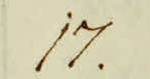17.
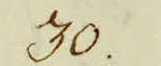30.
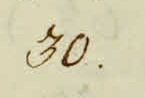30.
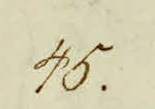45.
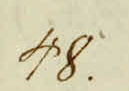48.
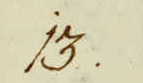13.
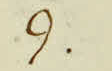9.
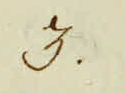3.
